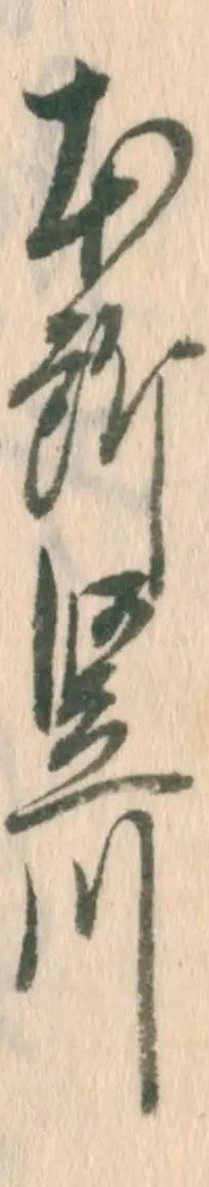本所堅川
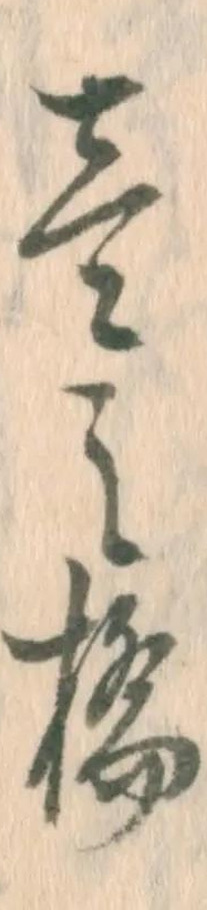壱之橋
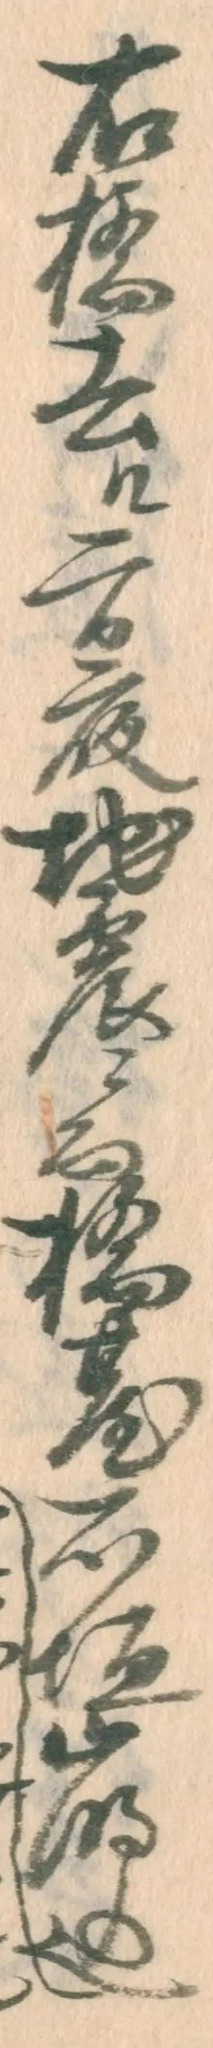右橋去ル二日夜地震ニ而橋台石垣崩込
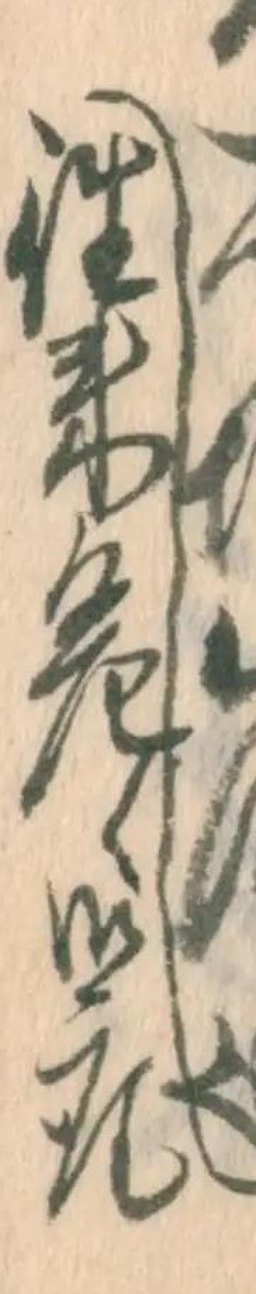往来危く御座

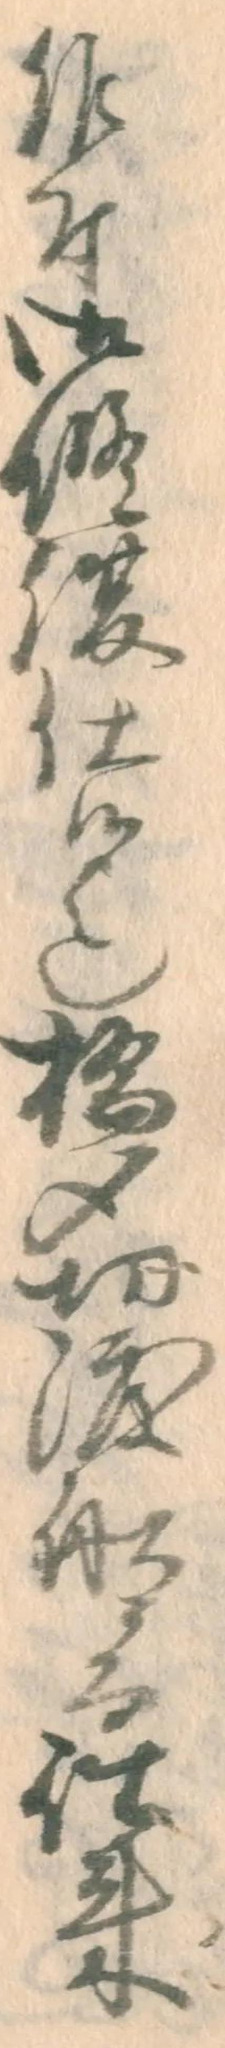候付御修復仕候迄橋〆切渡船ニ而往来
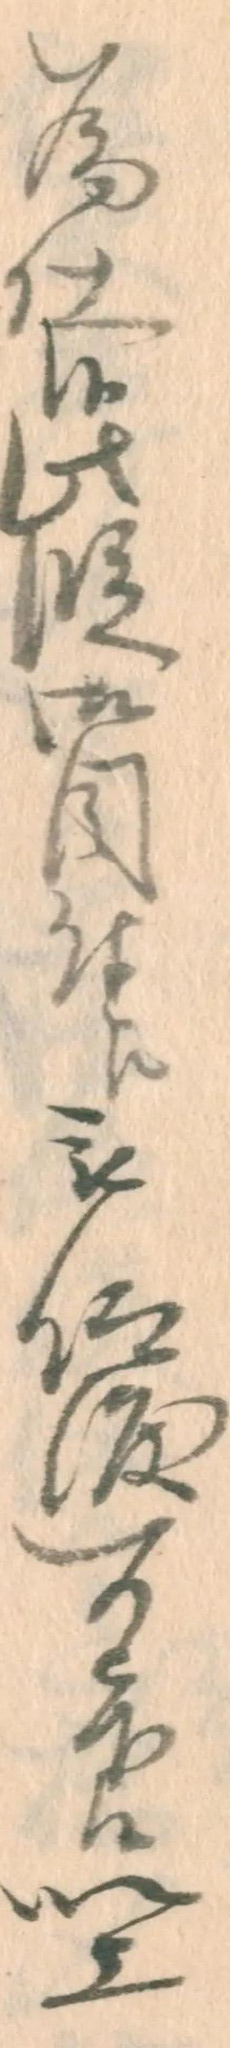為仕候此段御目付え被仰渡可被下候以上
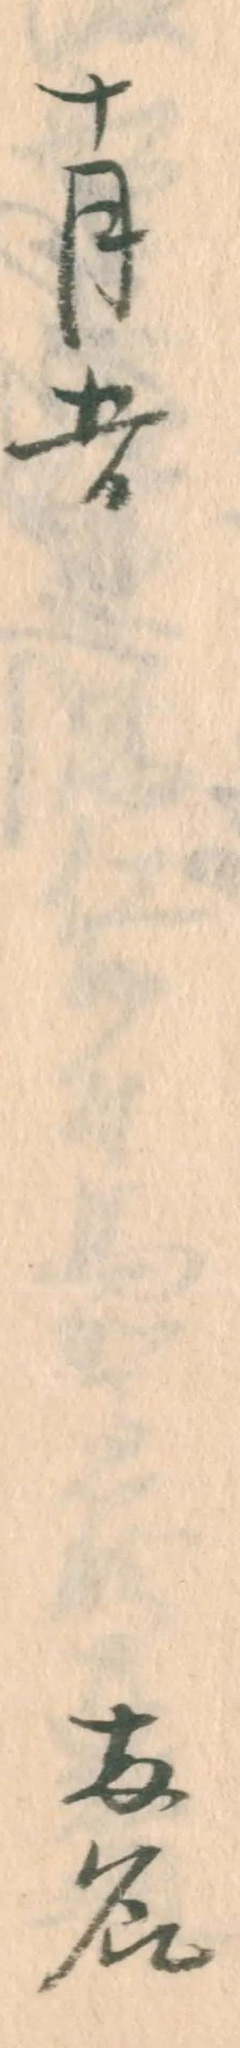十月五日両名
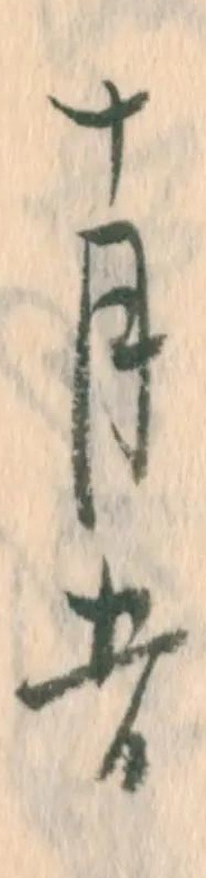十月五日
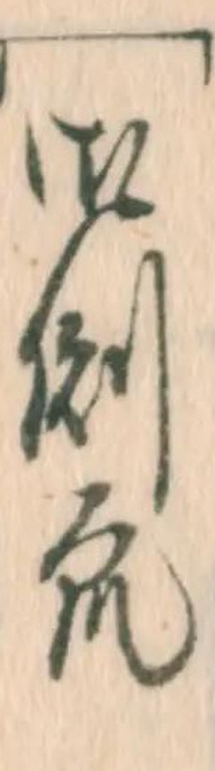[御側衆
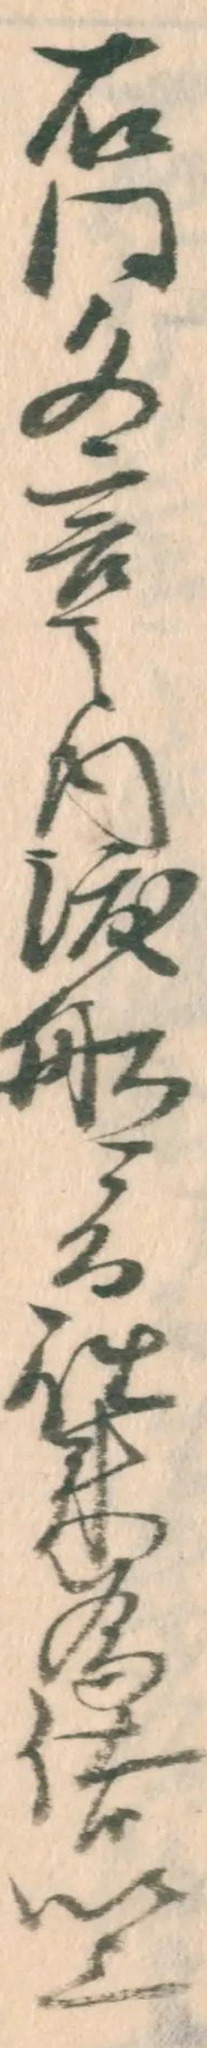右同文言之内渡船ニ而往来為仕候以上
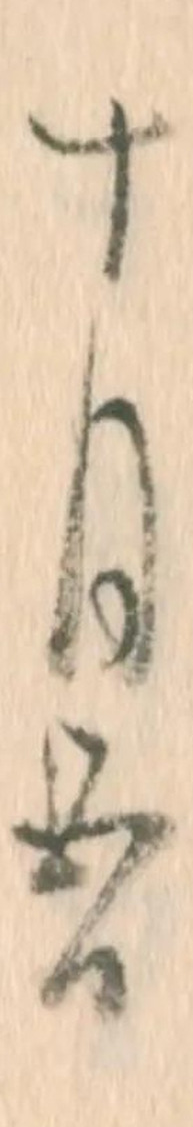十月五日

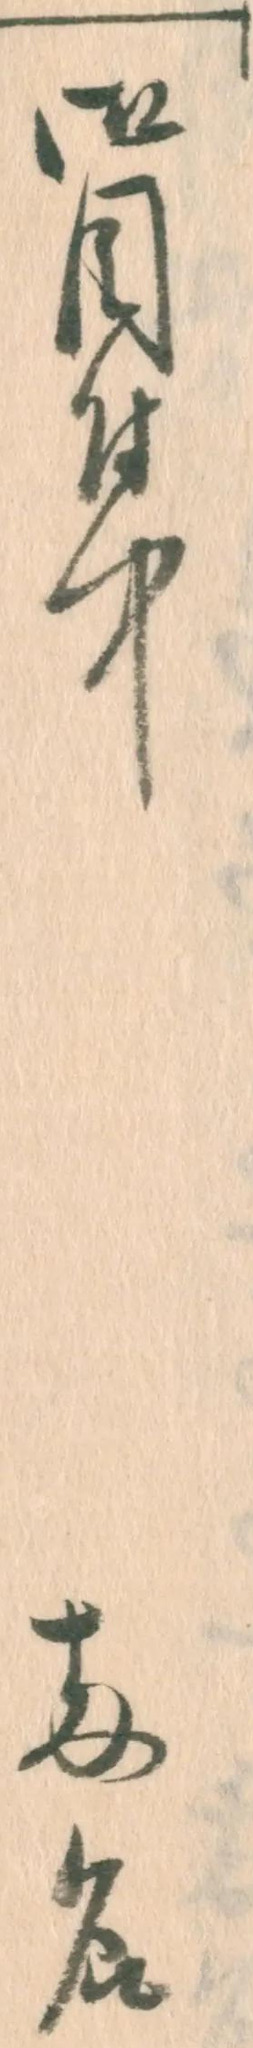[御目付中両名
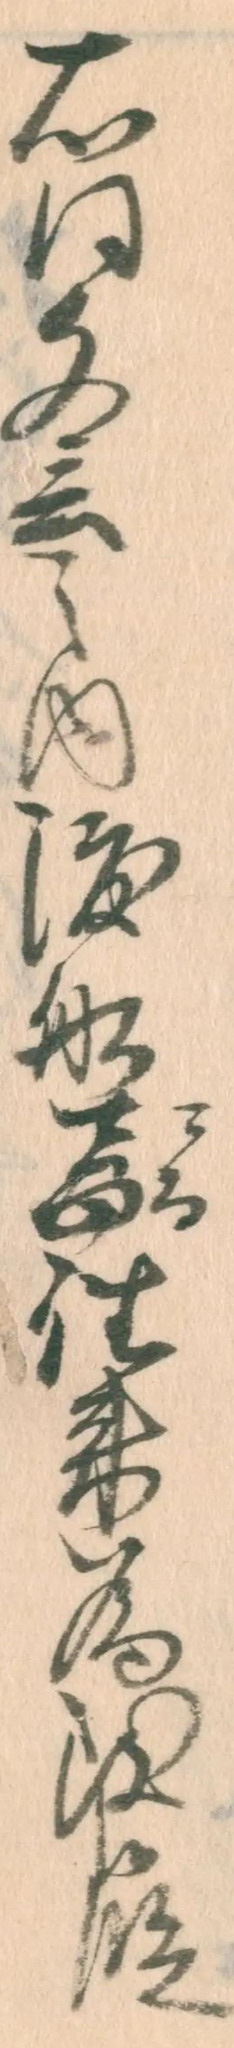右同文言之内渡船ニ而往来為致候段
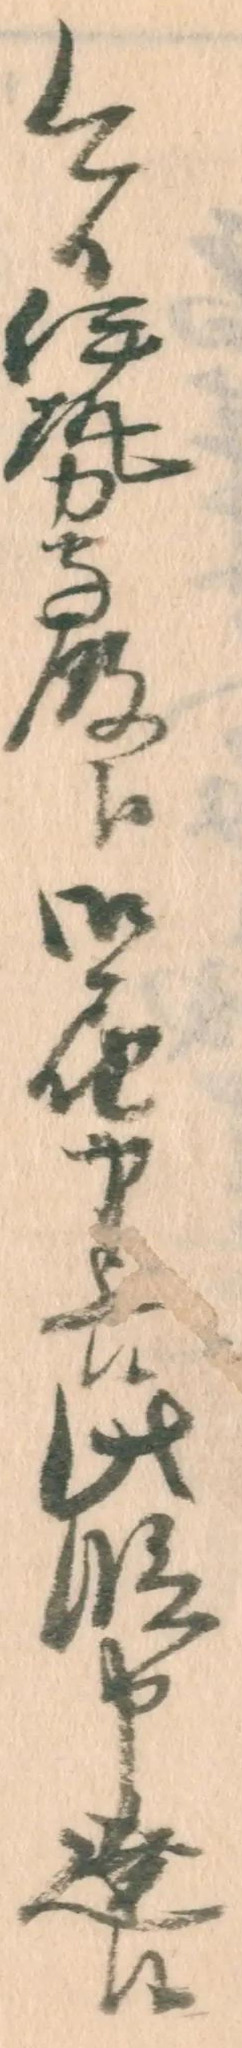今日伊勢守殿え御届申上候此段申達候
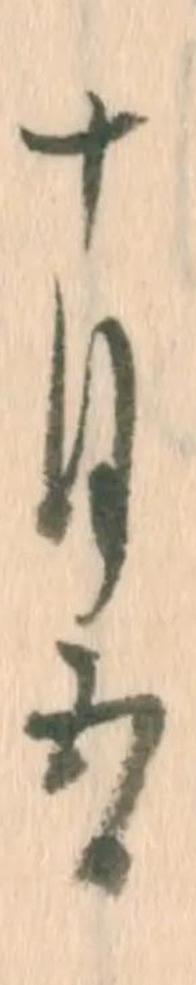十月五日
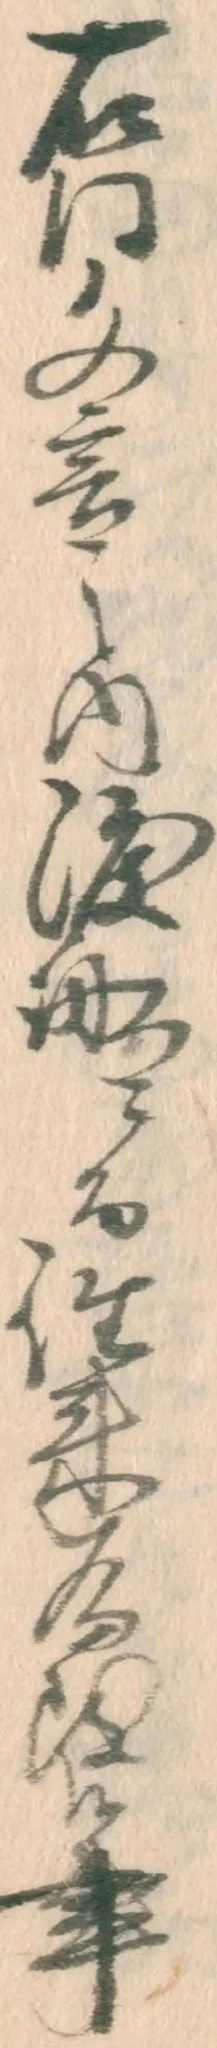右同文言之内渡船ニ而往来為致候事
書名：地震災書留 2巻. [1] 内表紙に「地震災書留　安政二卯年　但本所深川御用屋敷地代免除調」とあり
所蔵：国立国会図書館 National Diet Library, JAPAN
